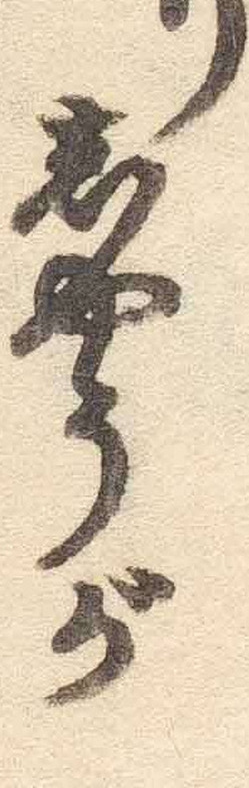しやうが
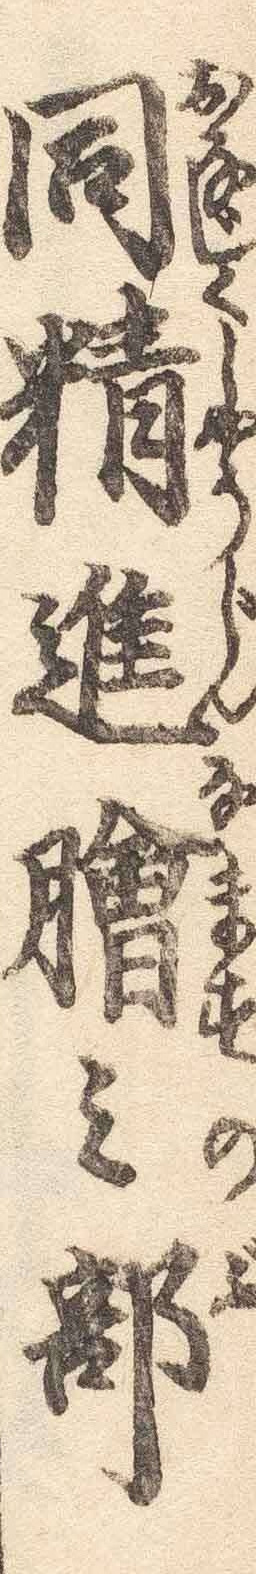同精進膾之部
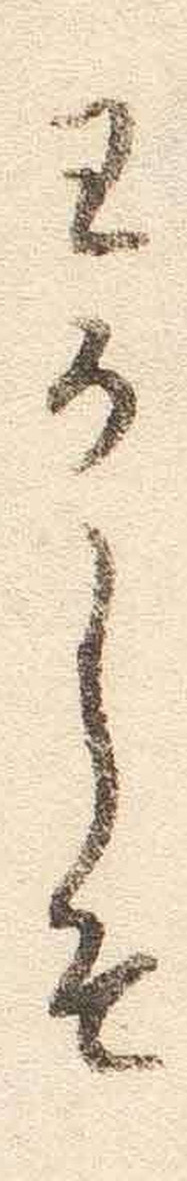わかしそ
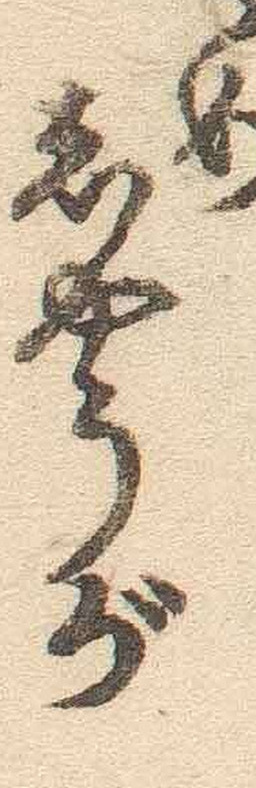しやうが

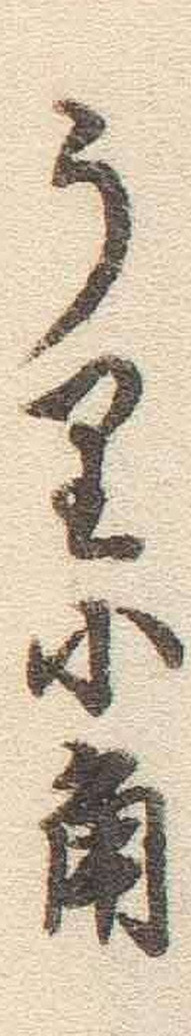くり小角
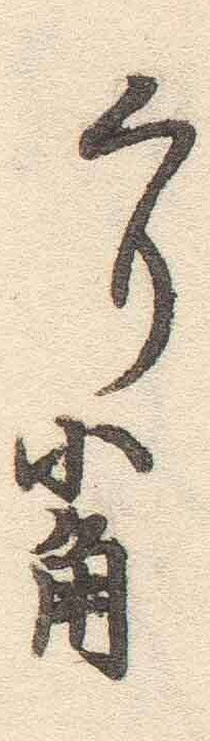くり小角
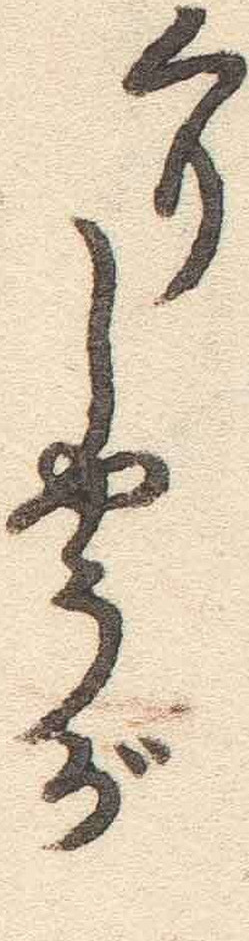しやうが
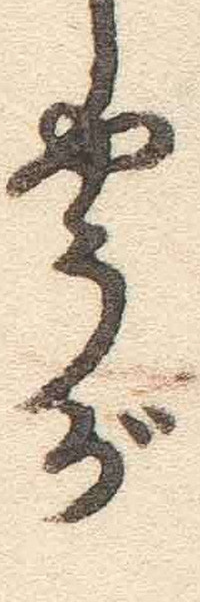しやうが
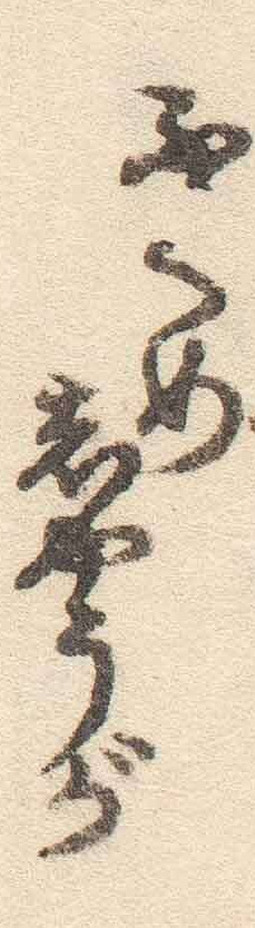しやうが
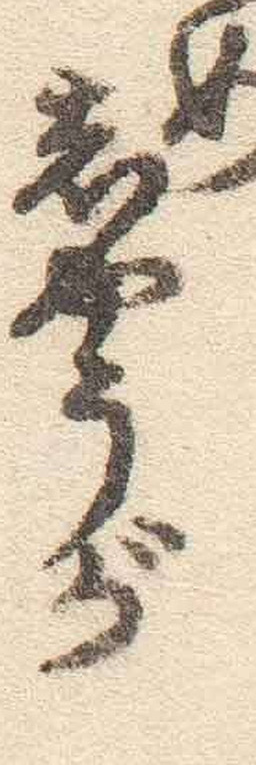しやうが
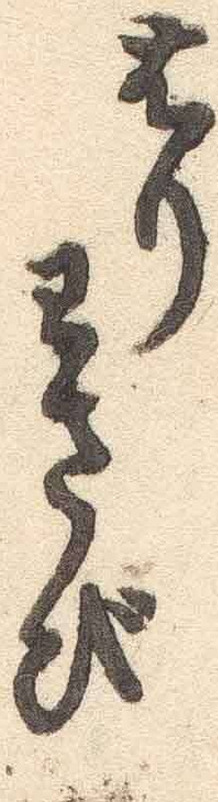わさび
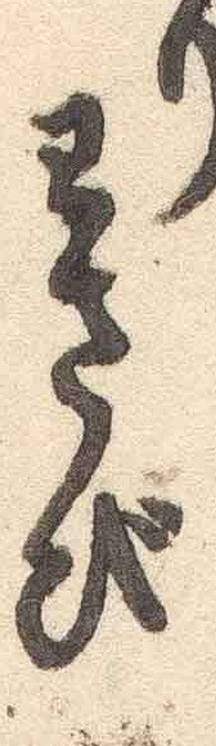わさび
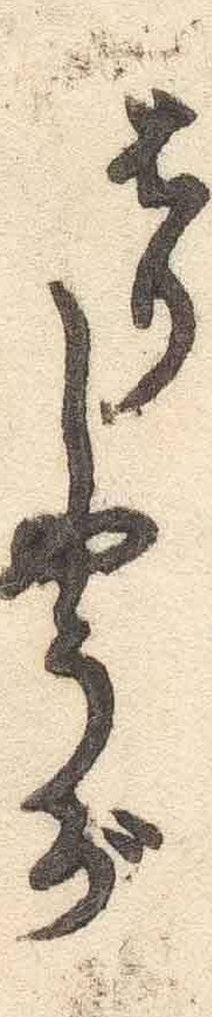はりしやうが
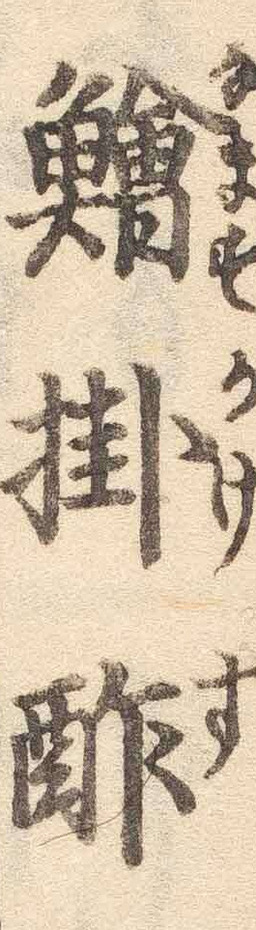鱠掛酢
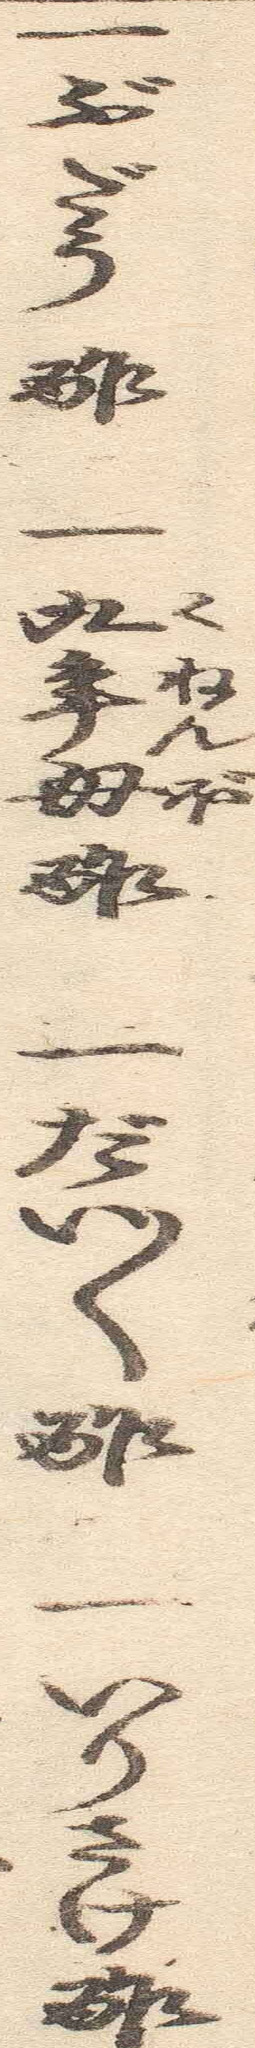一ぶだう酢一九年母酢一だい〳〵酢一いりさけ酢
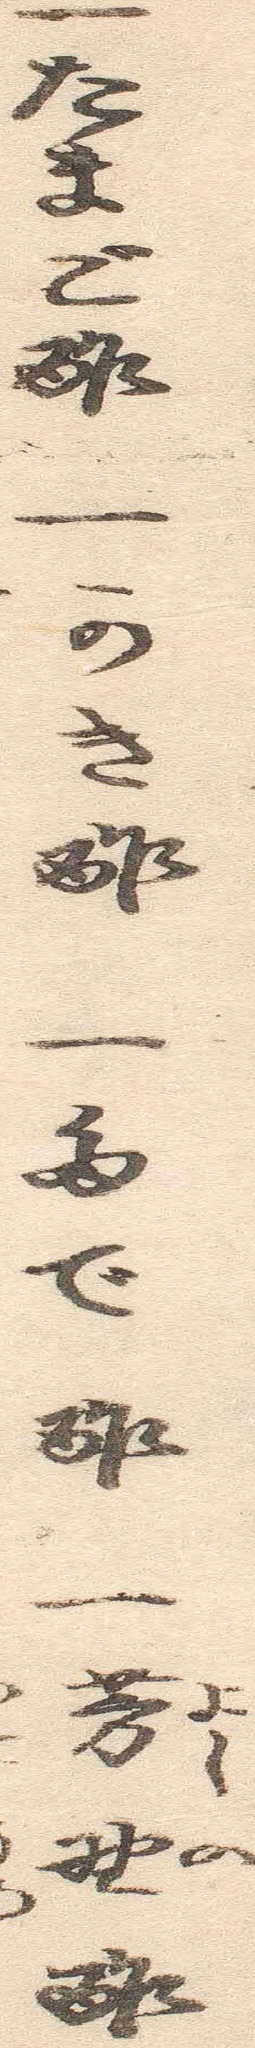一たまご酢一かき酢一たで酢一芳野酢
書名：料理通
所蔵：東京学芸大学附属図書館 国文学研究資料館
